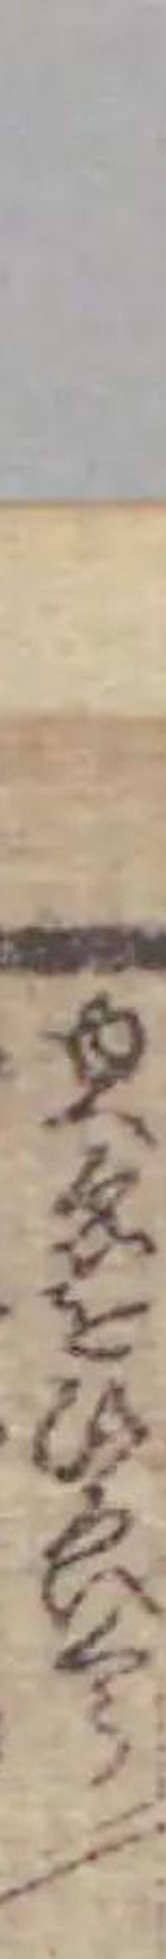ゆへゑをひろいくう
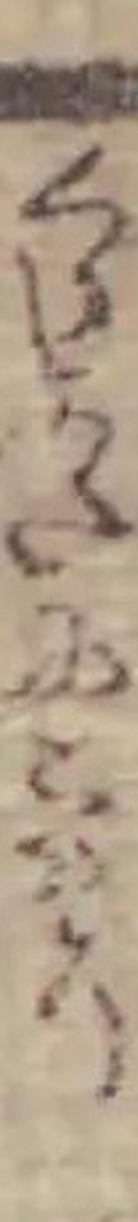くらしかたにこまり
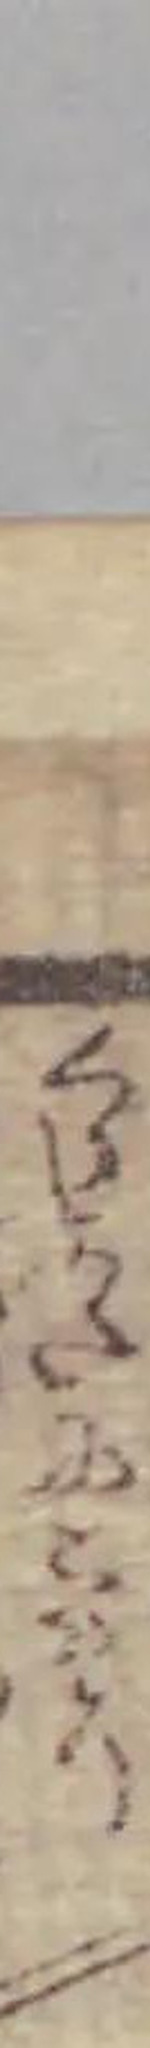くらしかたにこまり
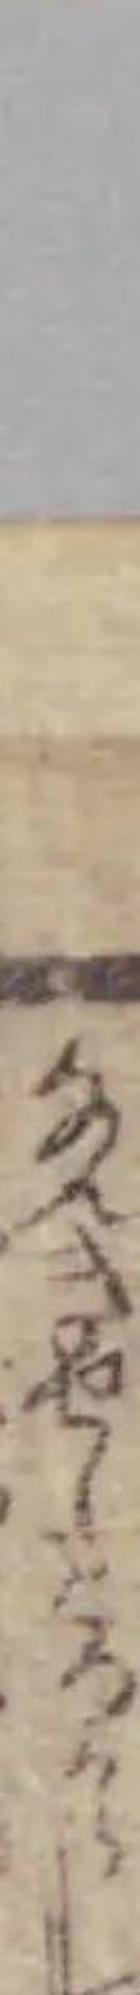なんぎせしをりから
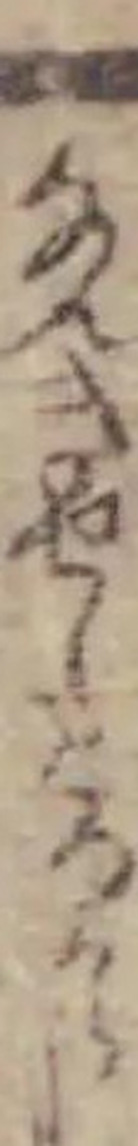なんぎせしをりから
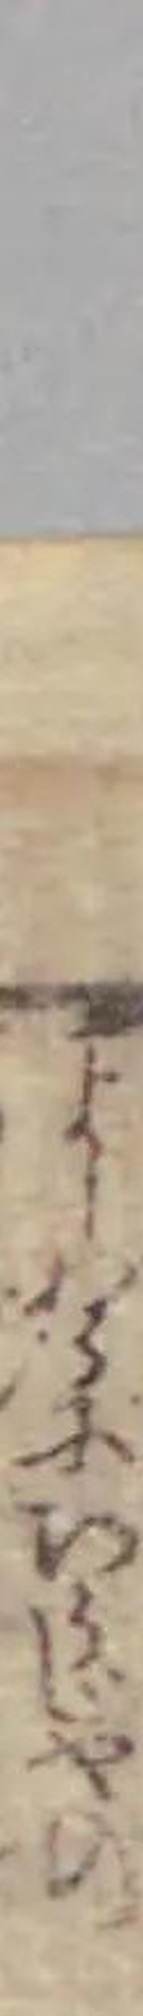よしわらにちうじやの
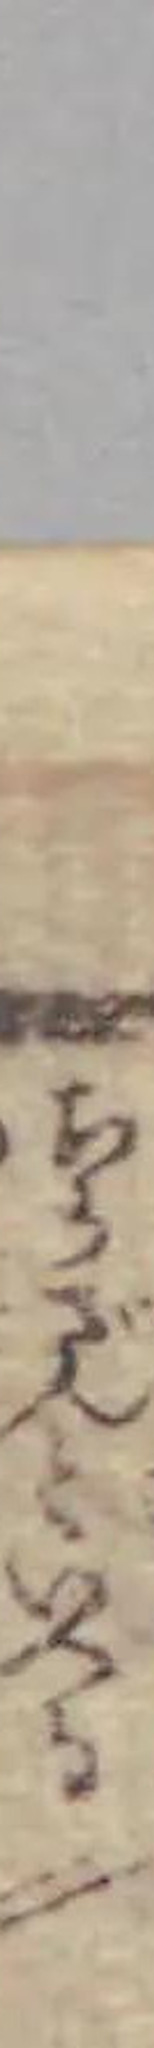ちうざんといへる
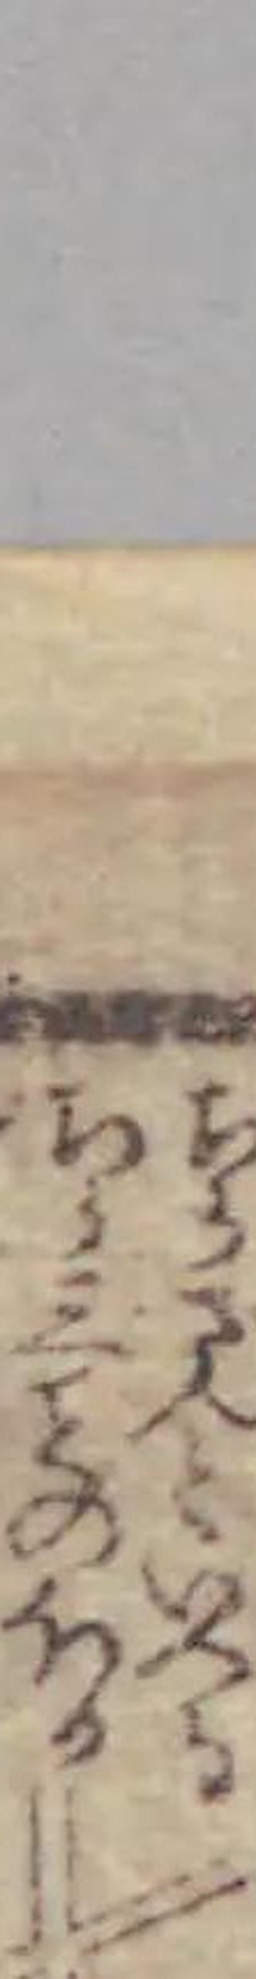ちう三ことのほか
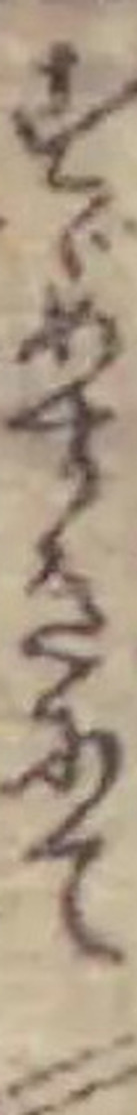すゞめすきにて
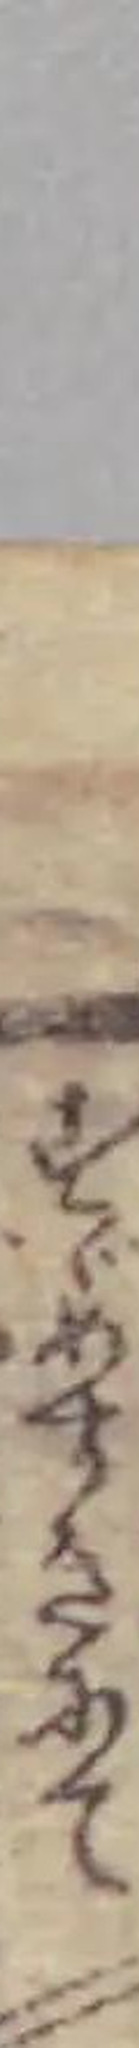すゞめすきにて
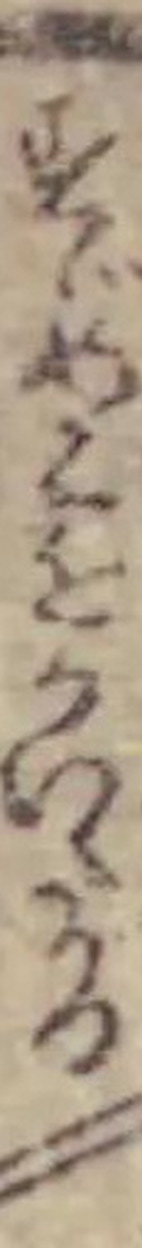すゞめこをかいたがる
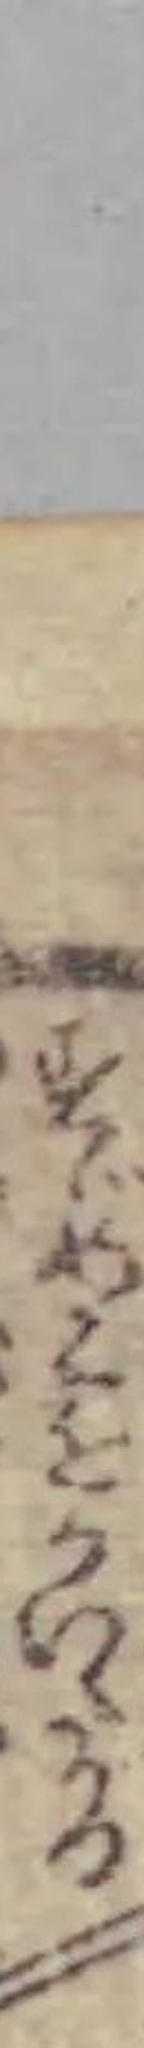すゞめこをかいたがる
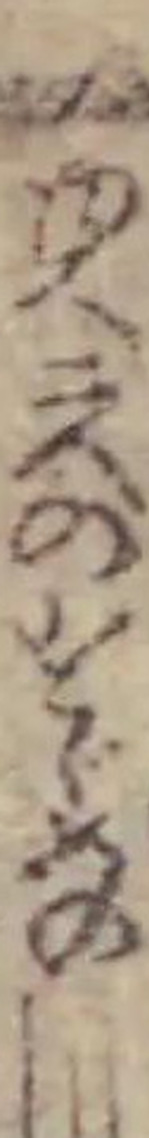ゆへ二人のすゞめの
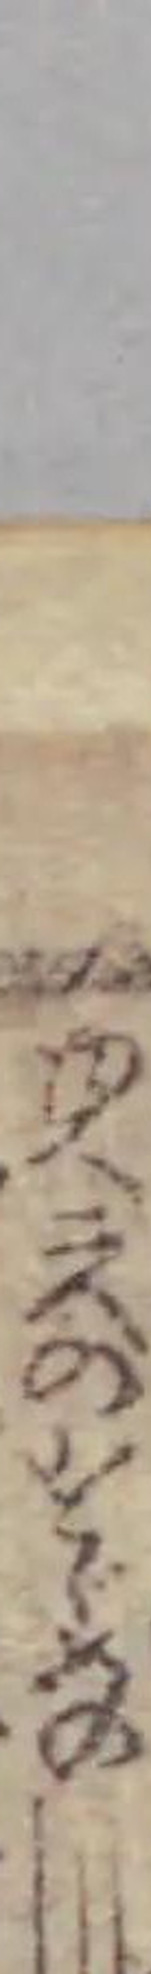ゆへ二人のすゞめの
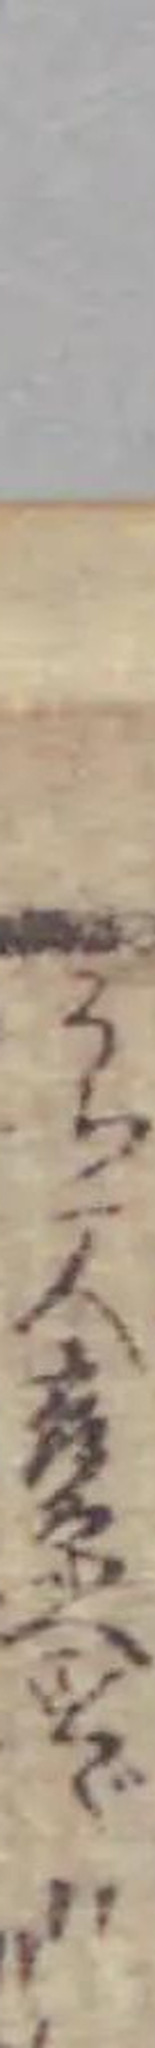うち一人吉原へすゞ
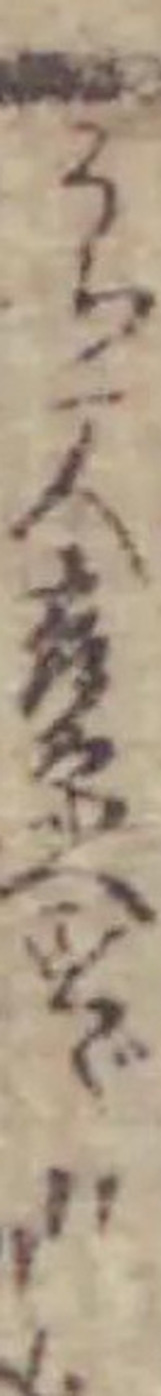うち一人吉原へすゞ
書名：冷水灰毛猫 2巻
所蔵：国立国会図書館 National Diet Library, JAPAN
